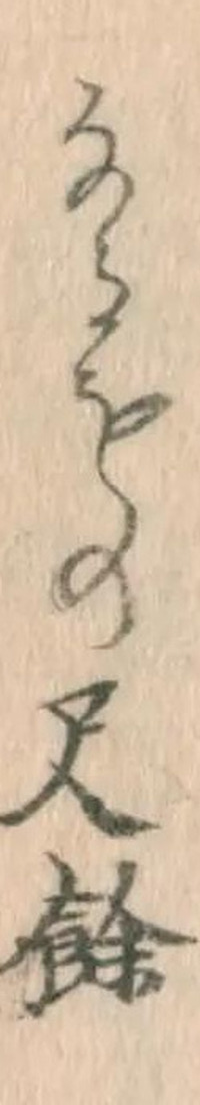なるもの尺余
